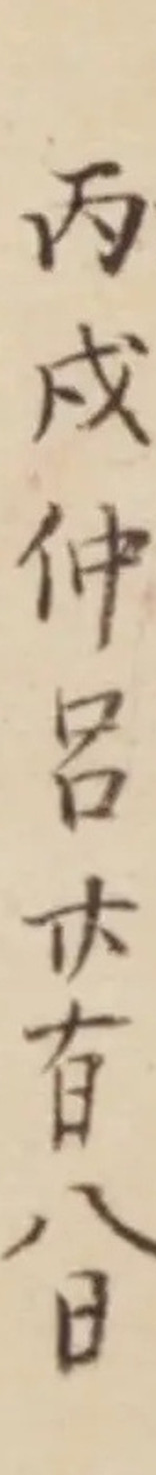丙戌仲呂亦有八日
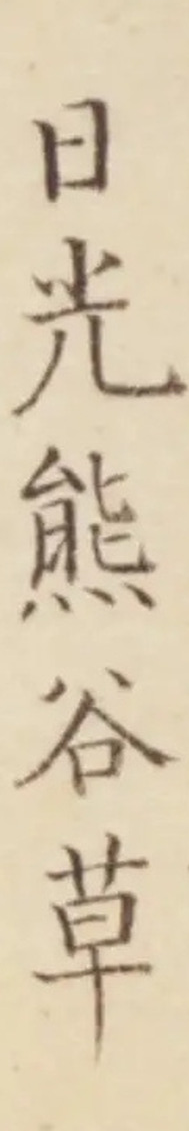日光熊谷草
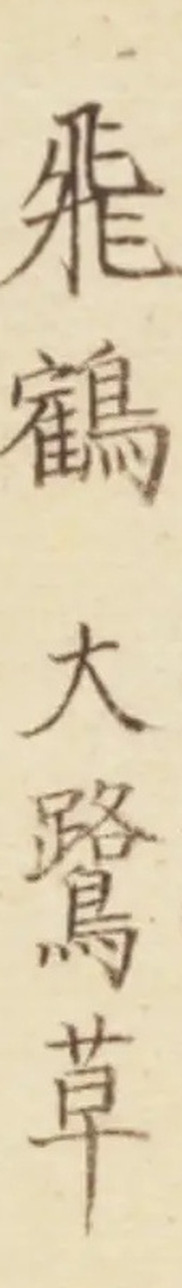飛鶴大鷺草
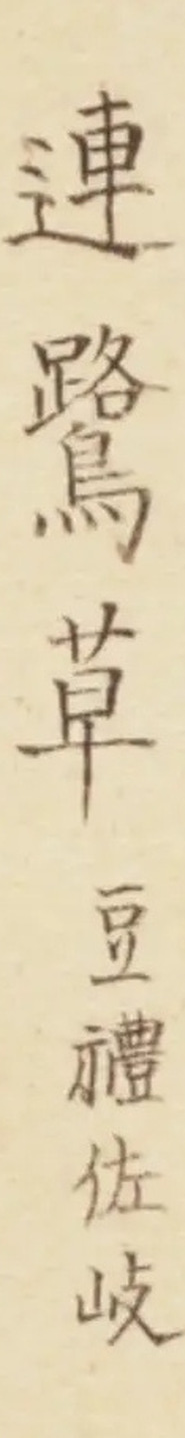連鷺草豆禮佐岐

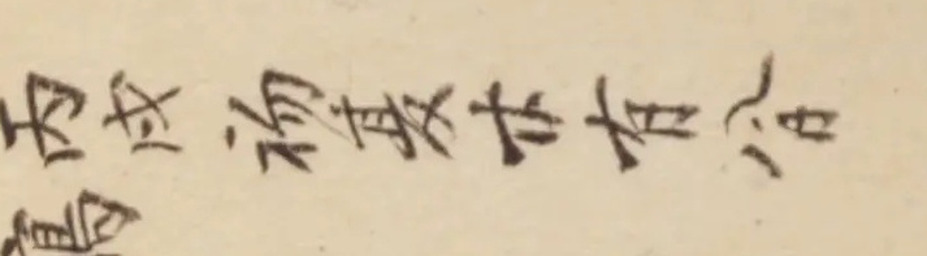丙戌初夏廿有八日

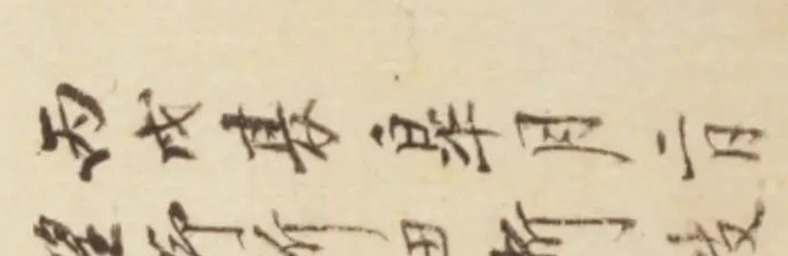丙戌夏皐月二日
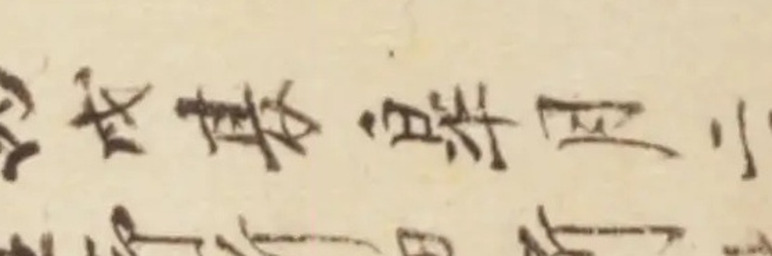丙戌夏皐月二日
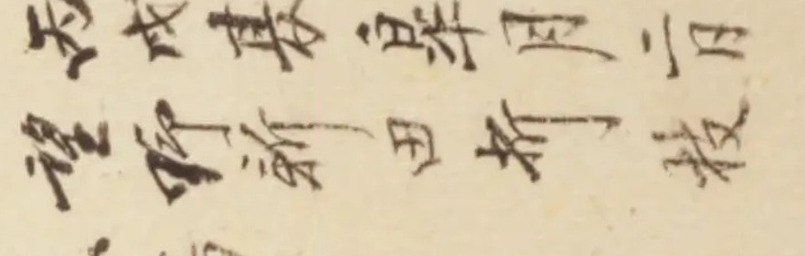望野新田折枝
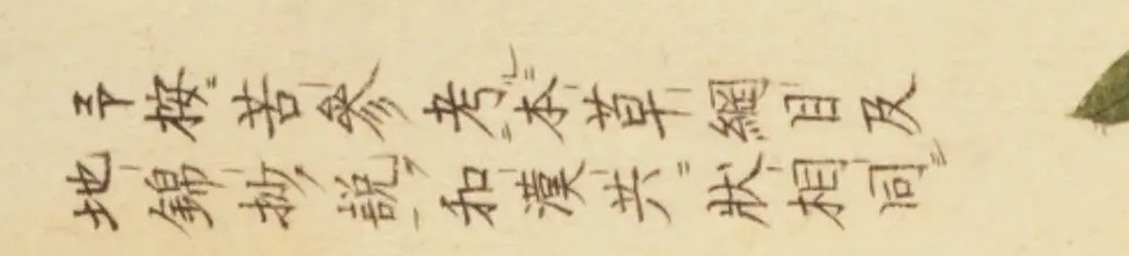予按に苦參参考るに本草綱目及
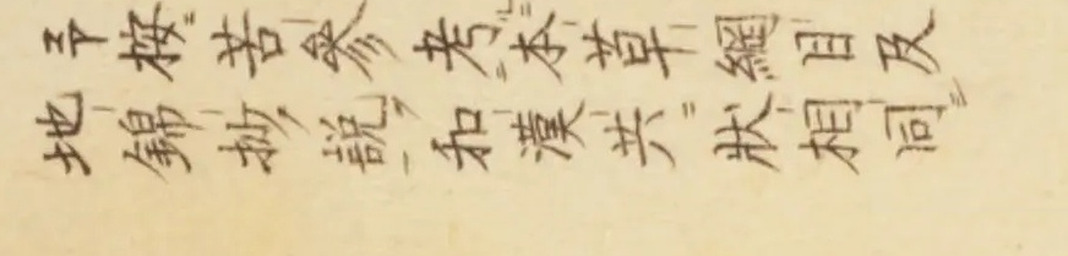地錦抄の説を和漢共に状相同し
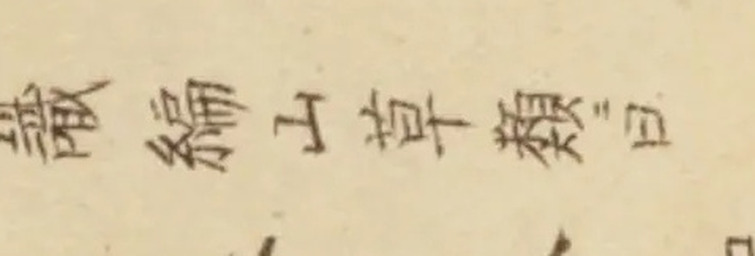多識編山草類に曰
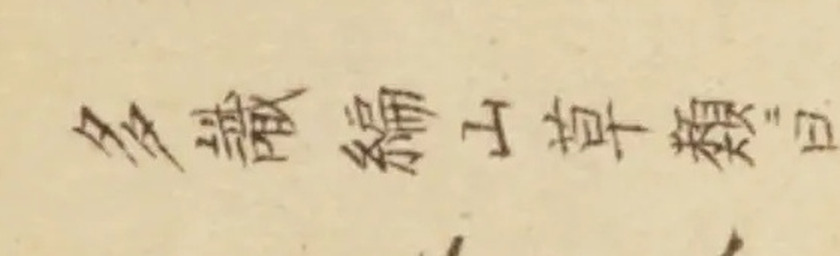多識編山草類に曰

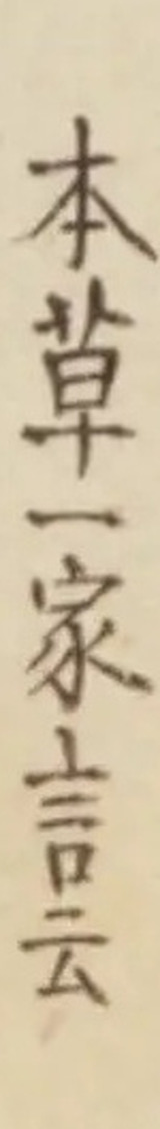本草一家言云

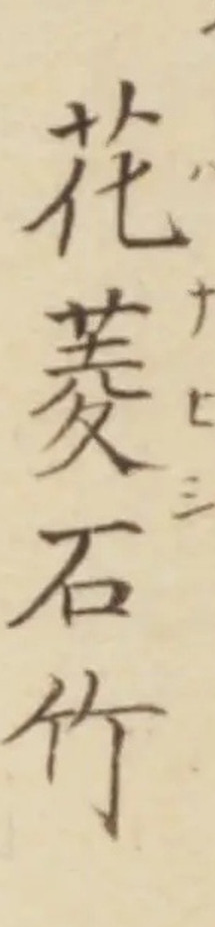花菱石竹
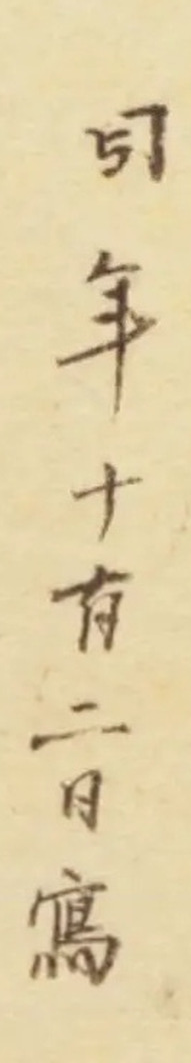同年十有二日寫

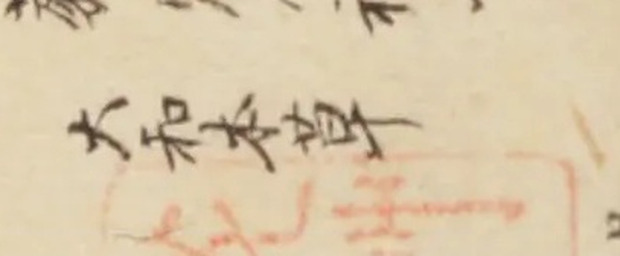大和本草
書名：梅園草木花譜夏之部. 3
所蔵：国立国会図書館 National Diet Library, JAPAN
